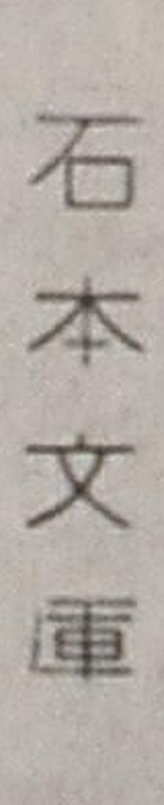石本文庫-

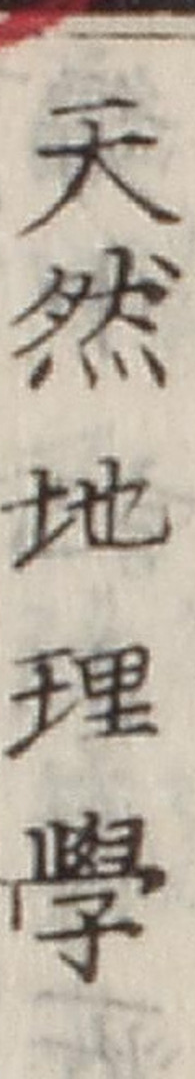天然地理学
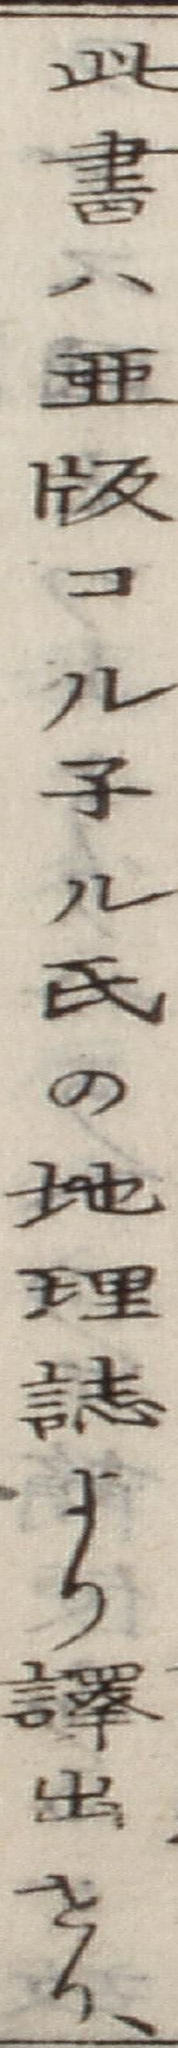此書は亜版コルネル氏の地理誌より訳出せり、
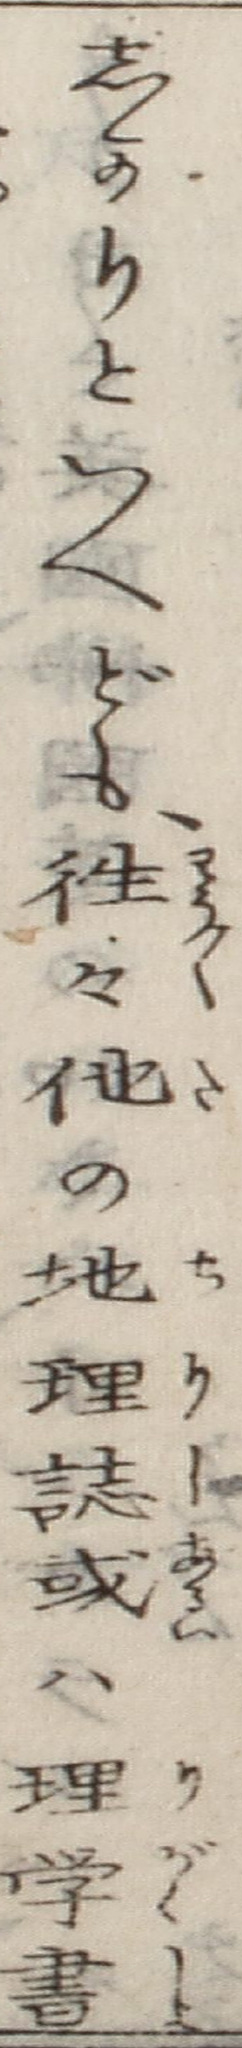しかりといへども、徃々他の地理志或は理学書
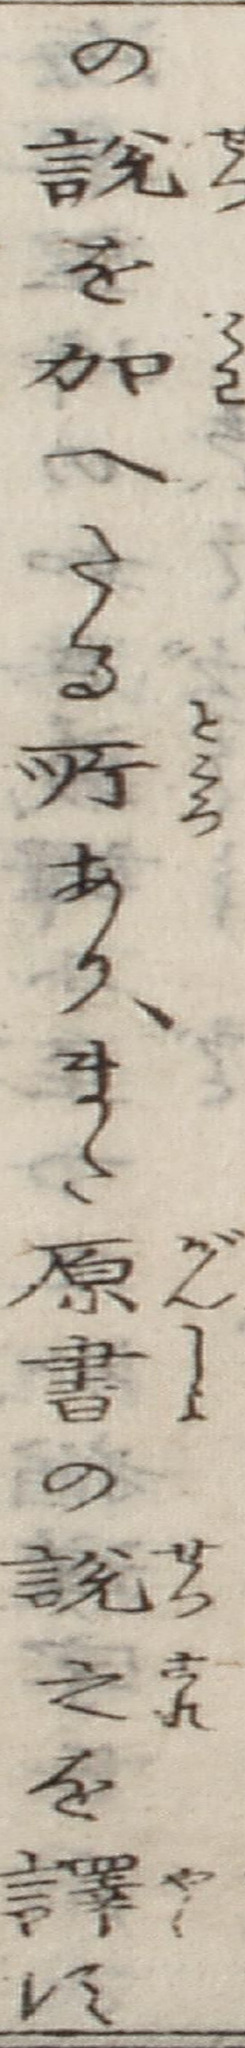の説を加へたる所あり、また原書の説之を訳す
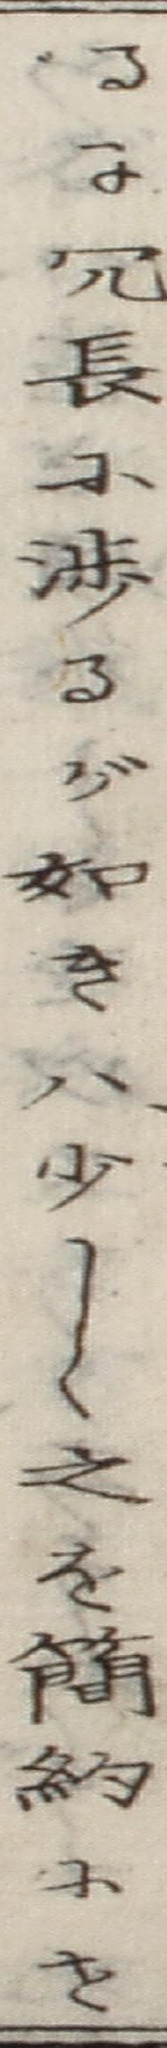るに冗長に渉るが如きは、少しく之を簡約にせ
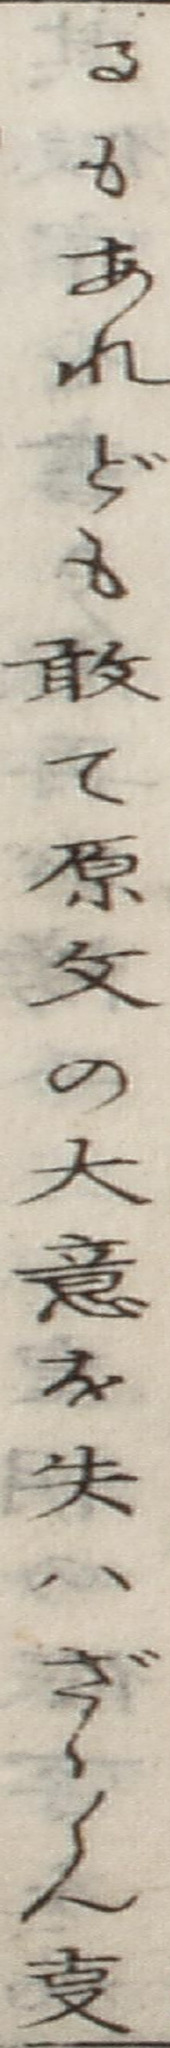るもあれども、敢て原文の大意を失はざらん事
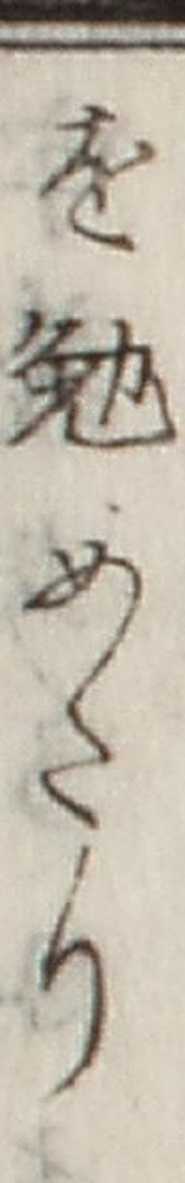を勉めたり
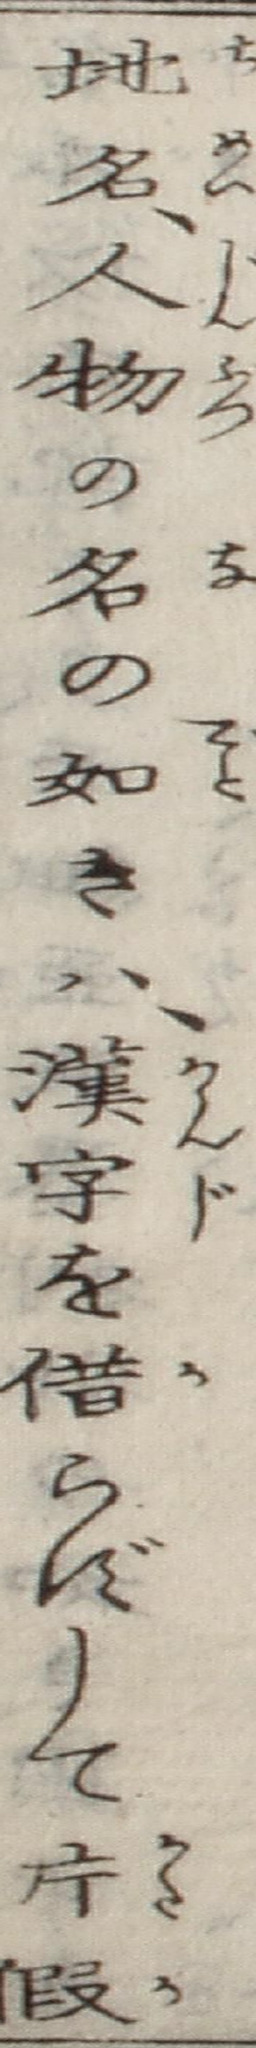地名、人物の名の如きは、漢字を借らずして片假

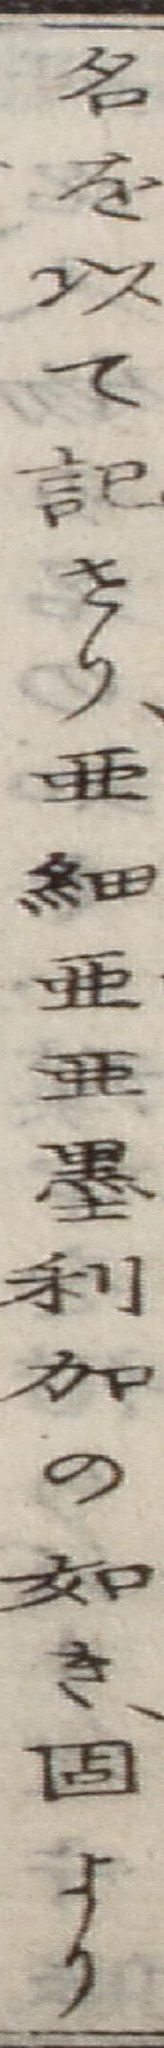名を以て記せり、亜細亜亜墨利加の如き、固より
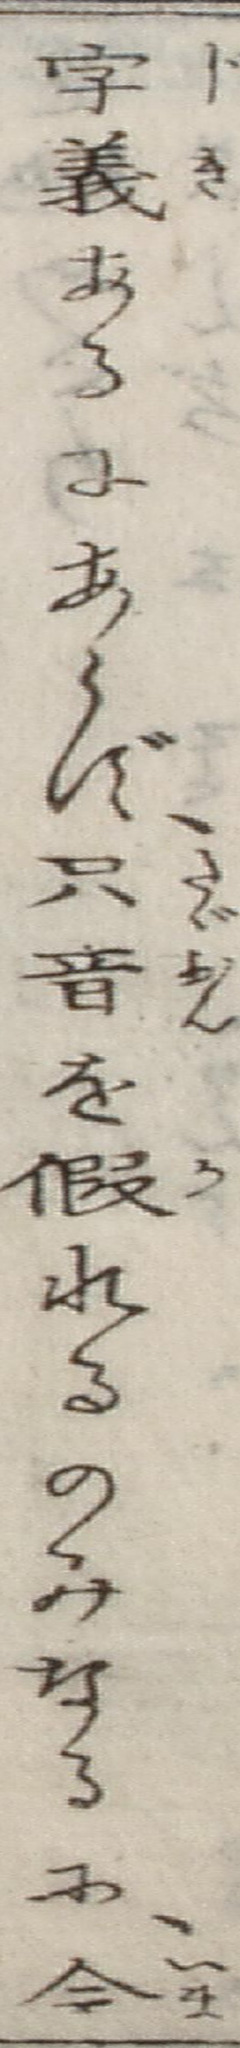字義あるにあらず、只音を假れるのみなるに、今
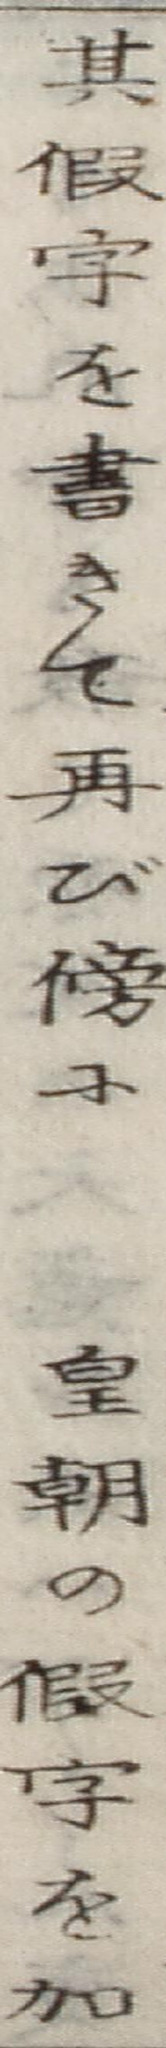其假字を書きて、再び傍に皇朝の假字を加
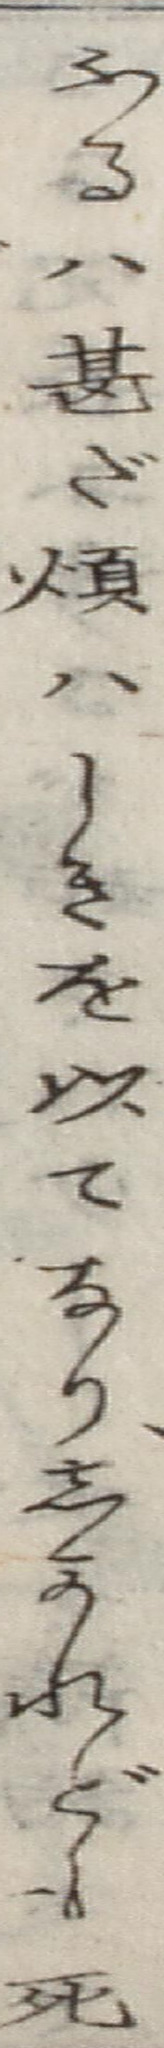ふるは、甚だ煩はしきを以てなり、しかれども死
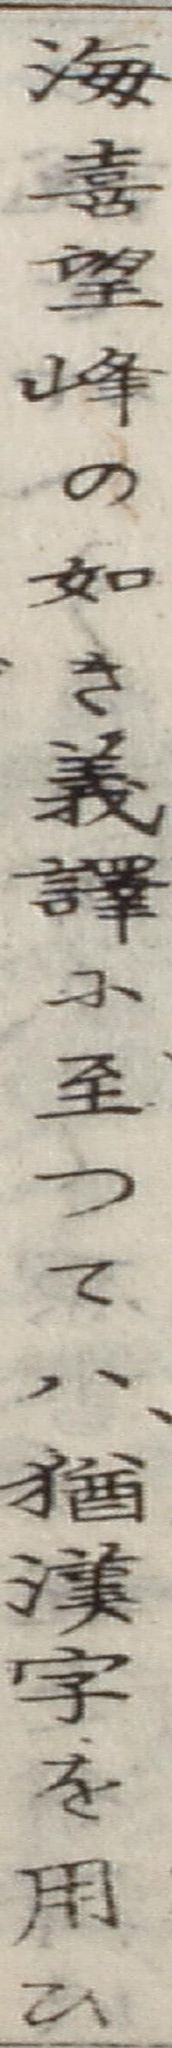海喜望峰の如き義訳に至つては、猶漢字を用ひ
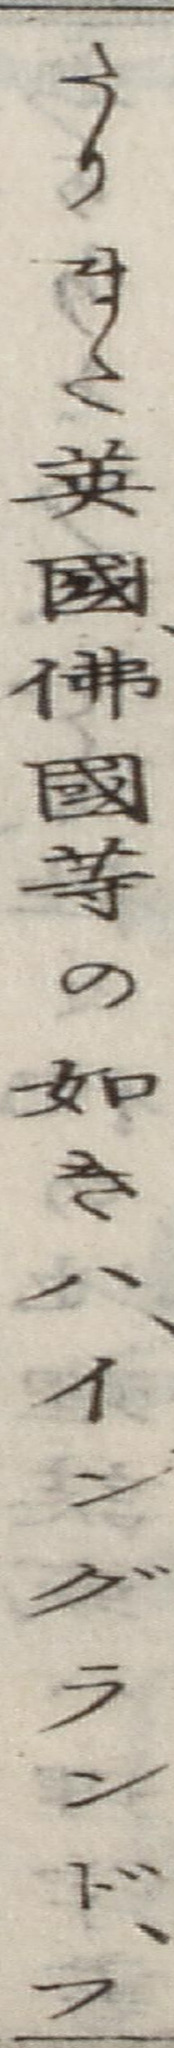たりまた英国、仏国等の如きは、イングランド、フ
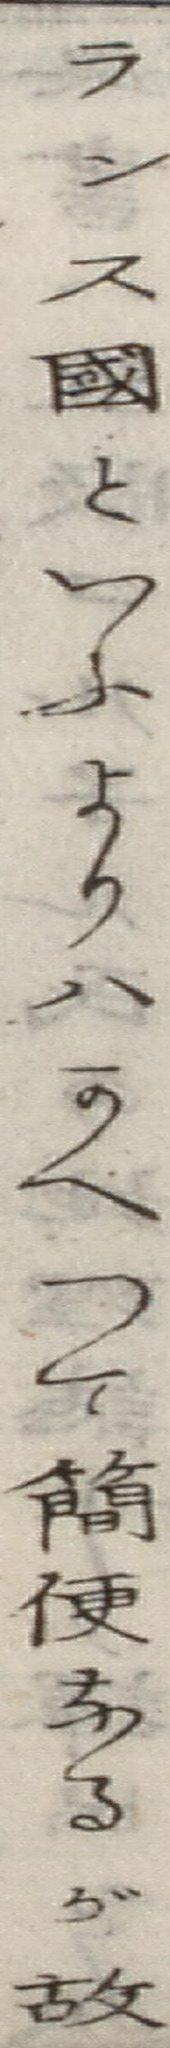ランス国といふよりはかへつて簡便なるが故
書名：訓蒙　天然地理學　上
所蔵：東京大学地震研究所図書室 Earthquake Research Institute Library, The University of Tokyo, JAPAN
